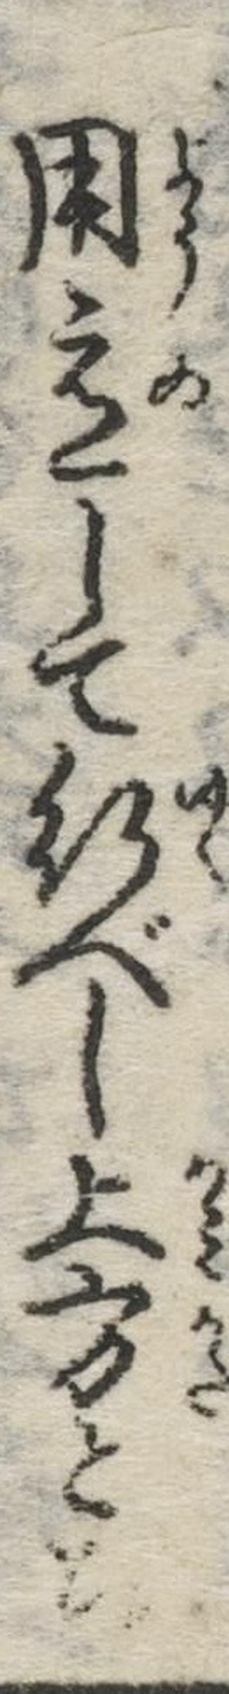用意して行べし上方とち
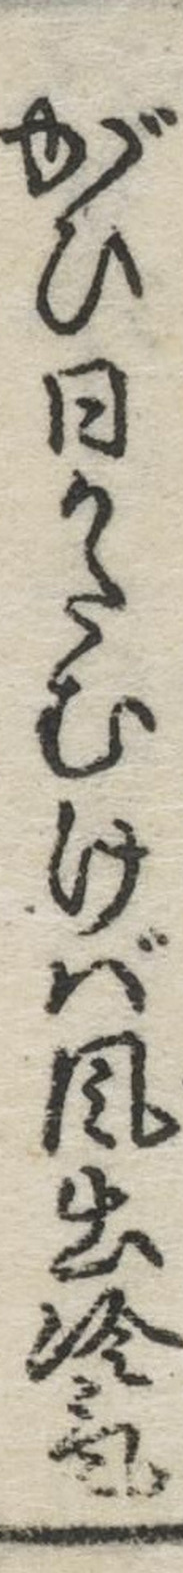がひ日かたむけば風出冷気
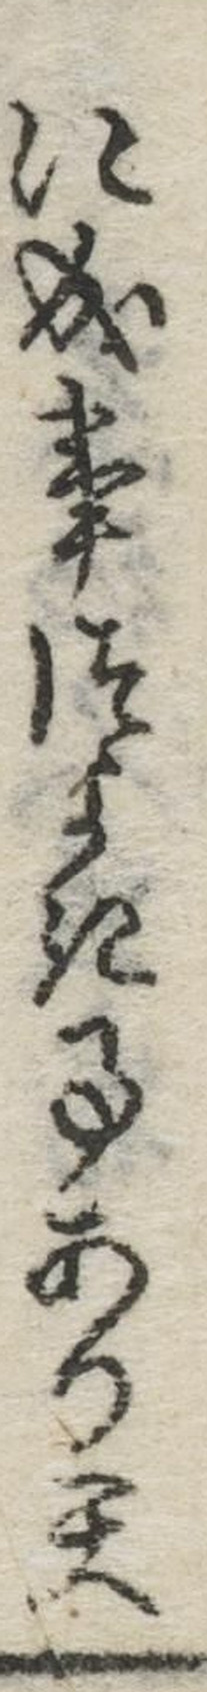に成事つよき事あり天
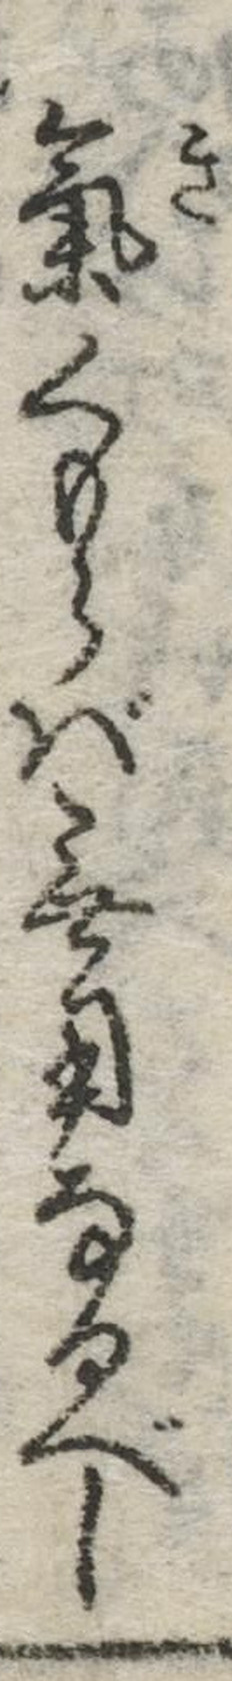気くもらば無用なるべし

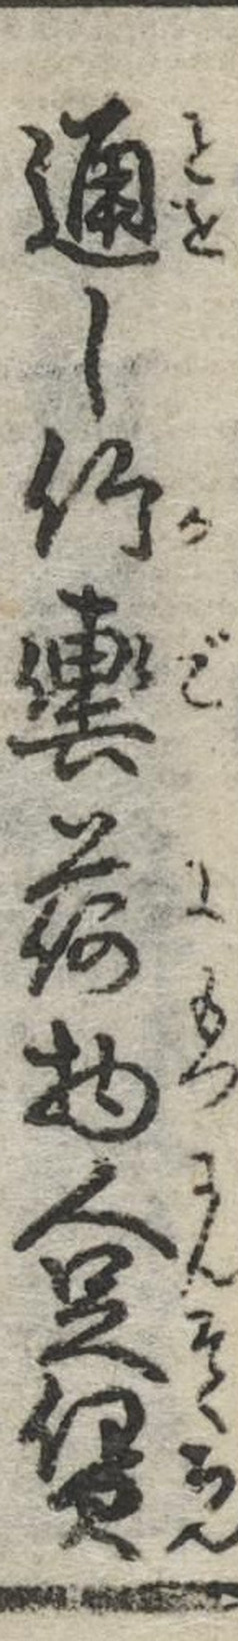通し竹輿荷物人足賃
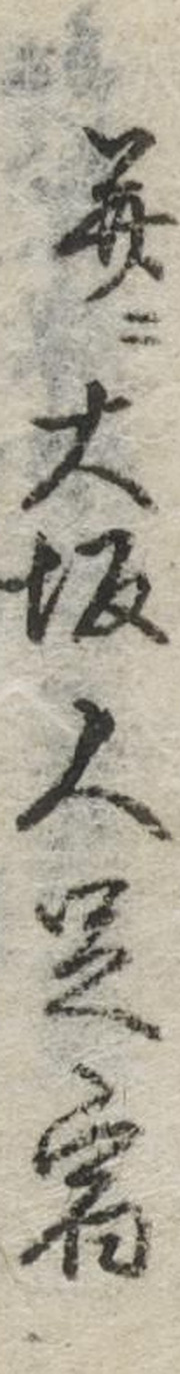並に大坂人足宿
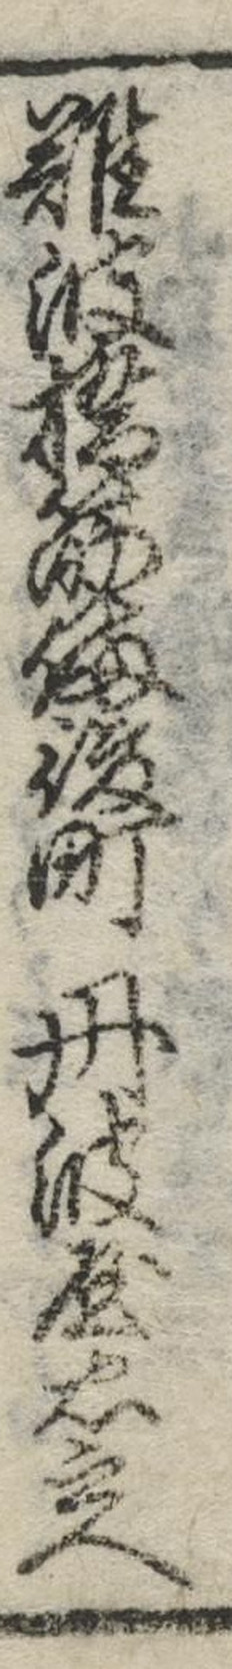難波橋筋備後町丹波屋忠兵へ
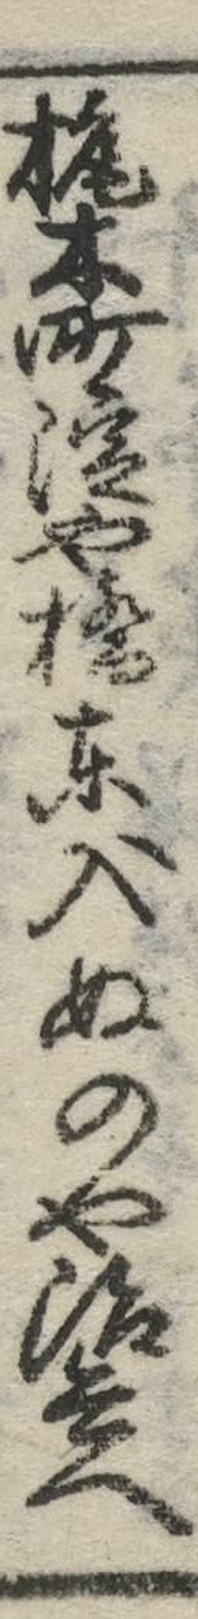梶木町淀や橋東へ入ぬのや清兵へ
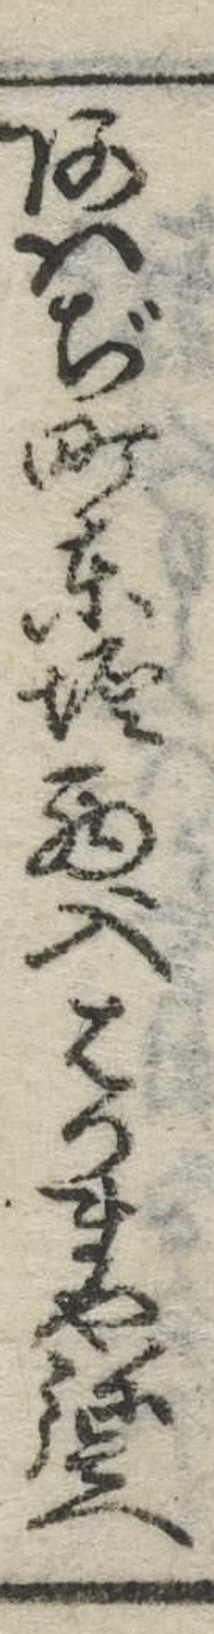あはぢ町東堀西へ入はつまや弥兵へ
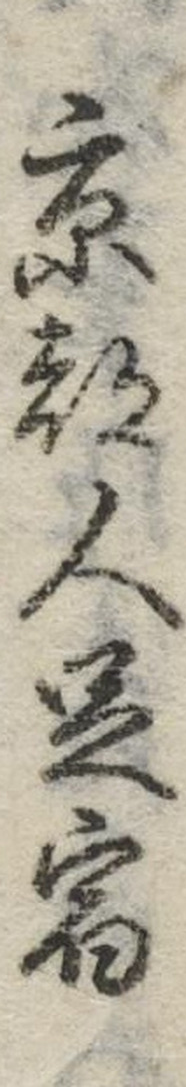京都人足宿
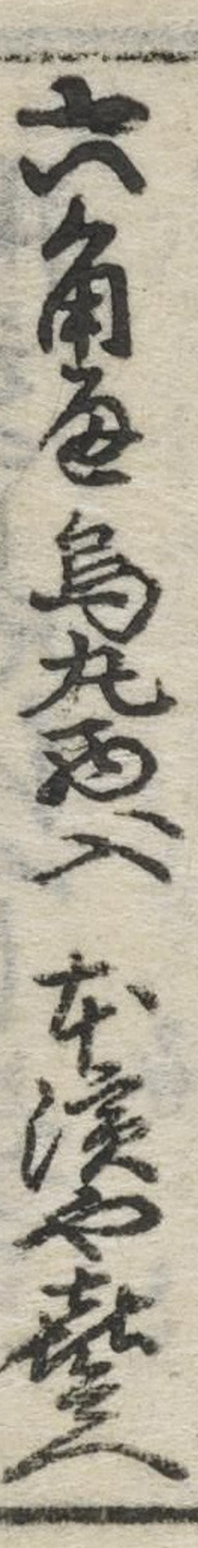六角通烏丸西へ入本濱や喜兵へ
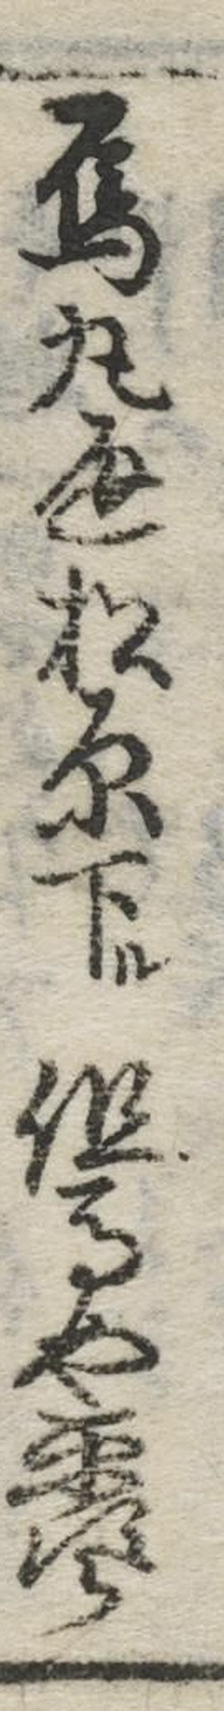烏丸通松原下る但馬や平次郎
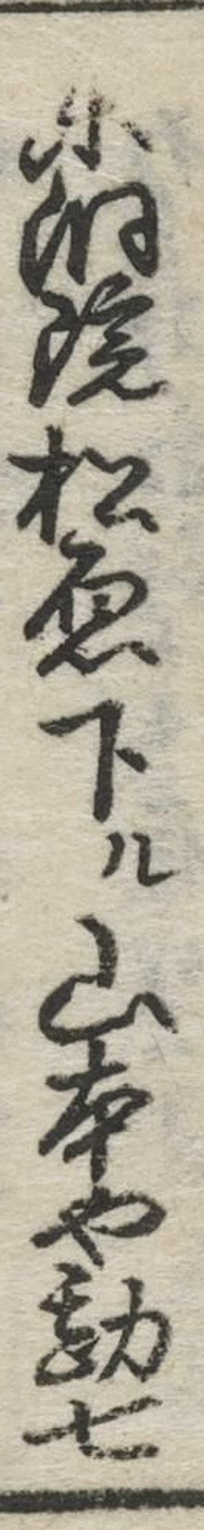東洞院松原下る山本や勘七
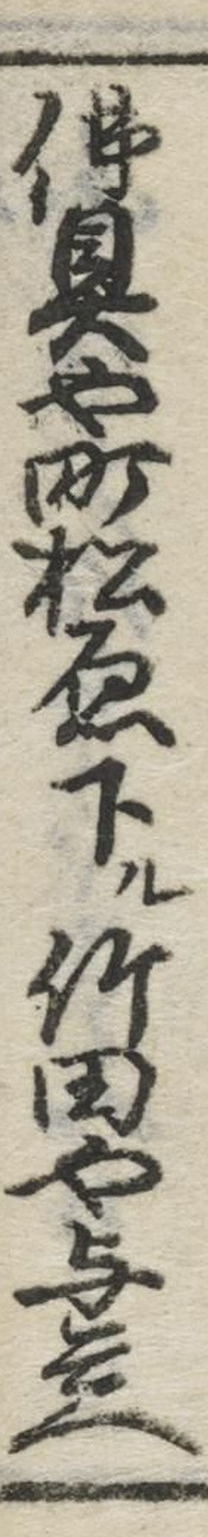仏具や町松原下る竹田や与兵へ
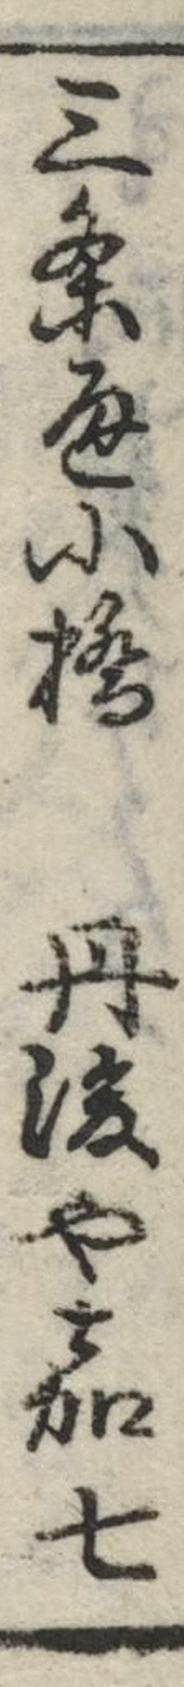三条通小橋丹後や嘉七
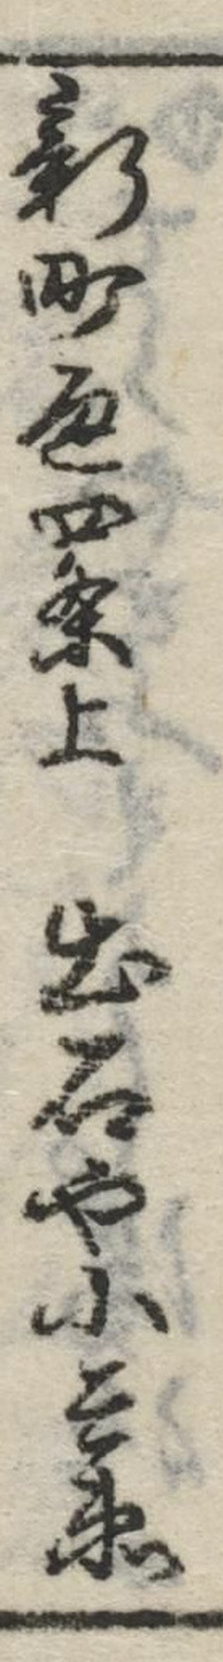新町通り四条上出石や小兵衛
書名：但州城崎浴湯辧
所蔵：東京大学地震研究所図書室 Earthquake Research Institute Library, The University of Tokyo, JAPAN
